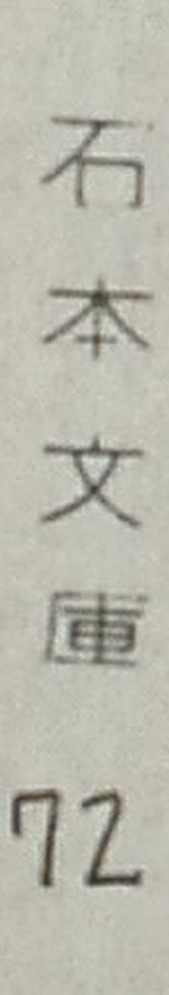石本文庫
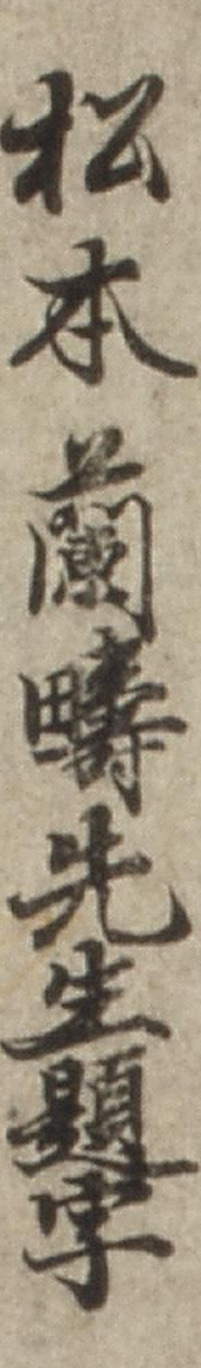松本蘭疇先生題字
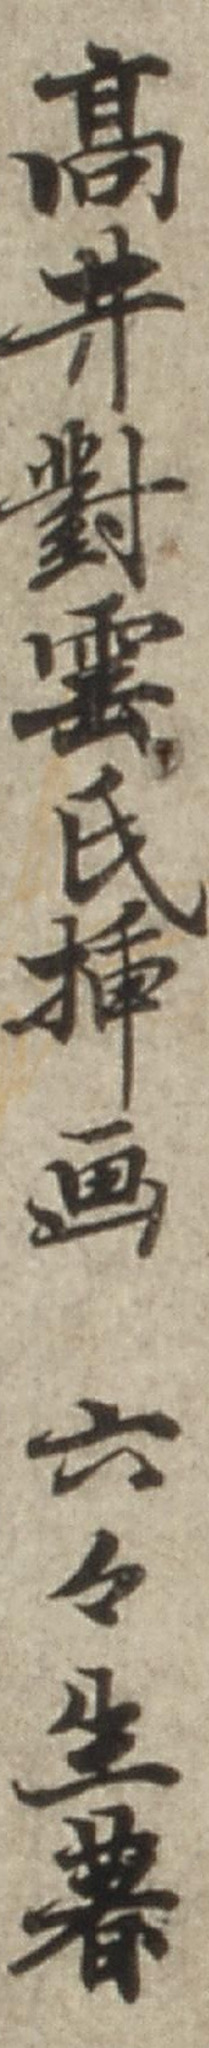髙井對雲氏挿画六々生著
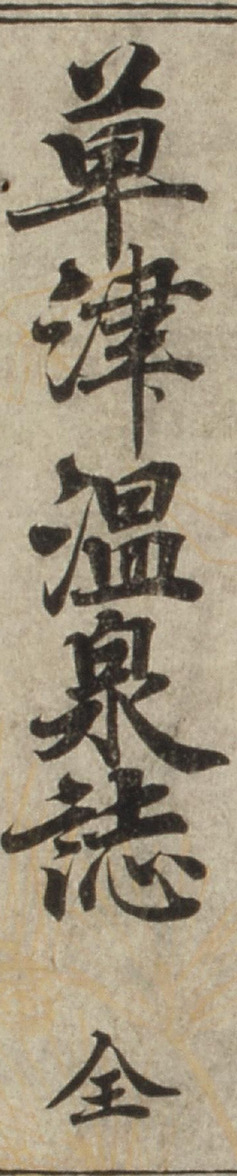草津温泉誌全
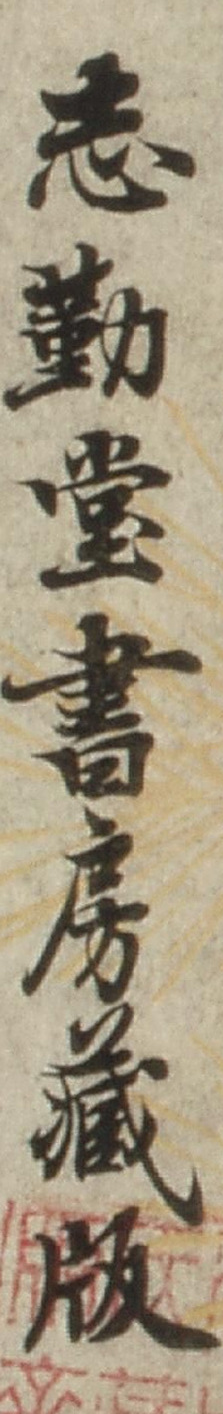志勤堂書房蔵版

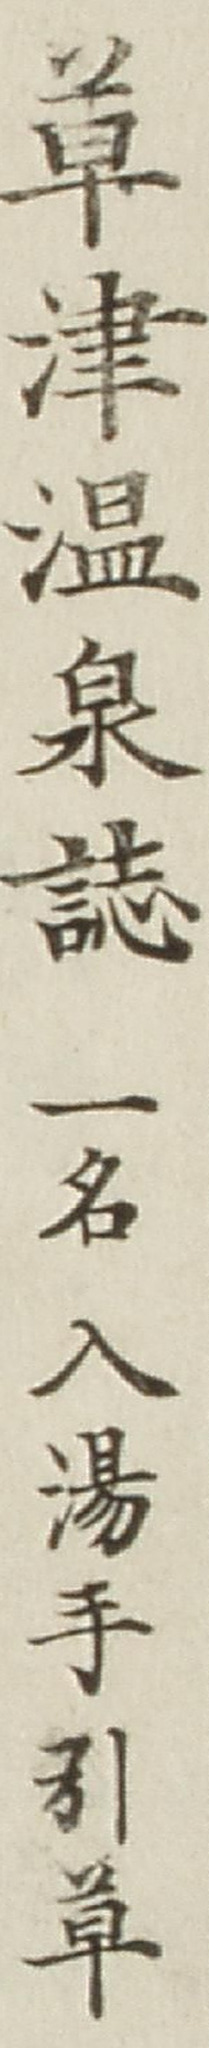草津温泉誌一名入湯手引草
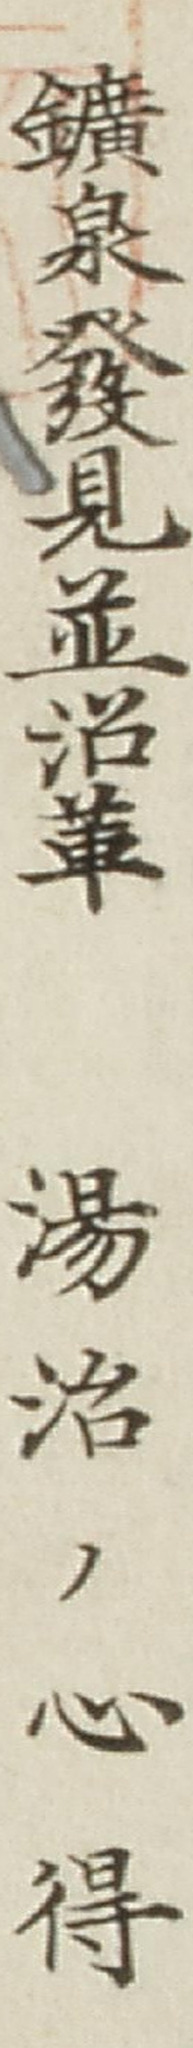鉱泉発見並沼草湯治ノ心得
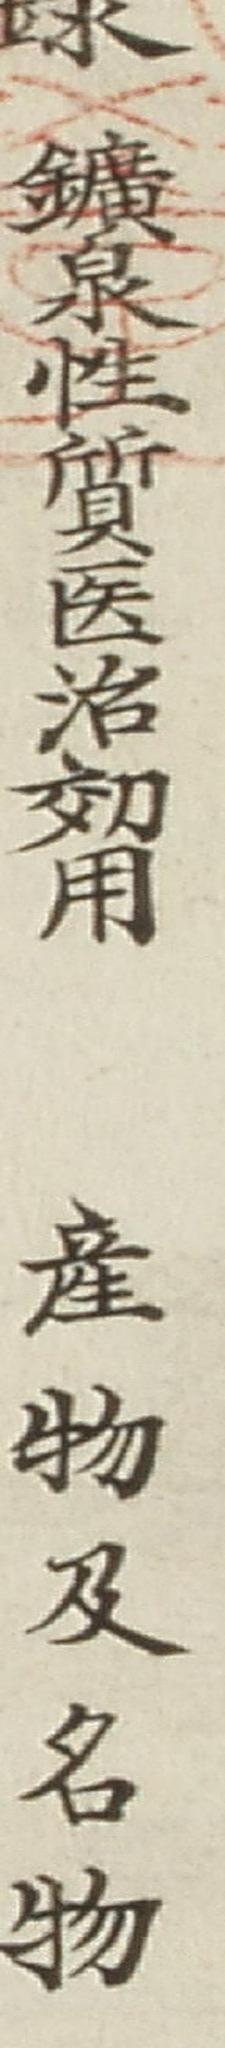録鉱山性質医治効用産物及名物
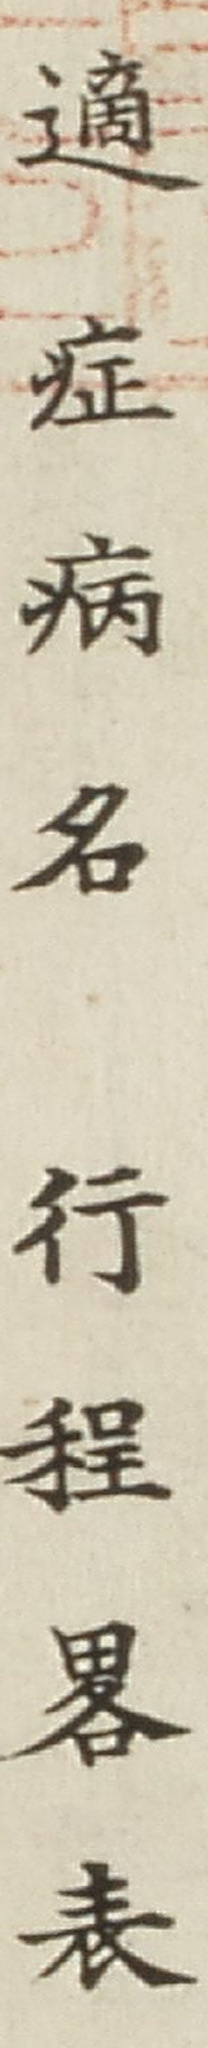適症病名行程略表

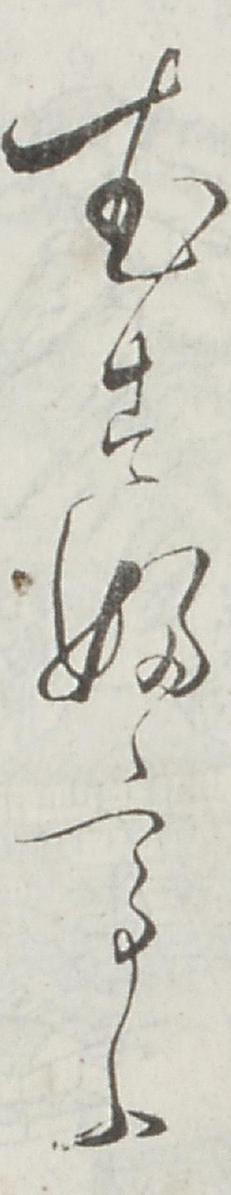むすふてふ
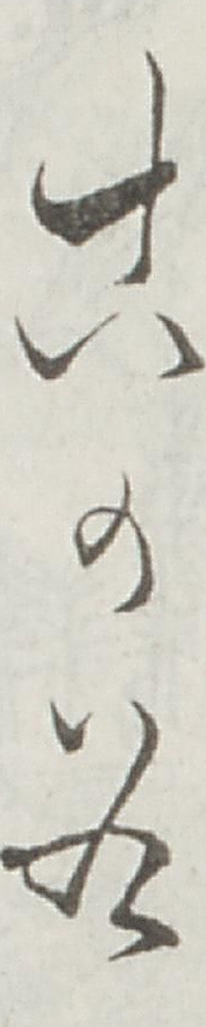この谷
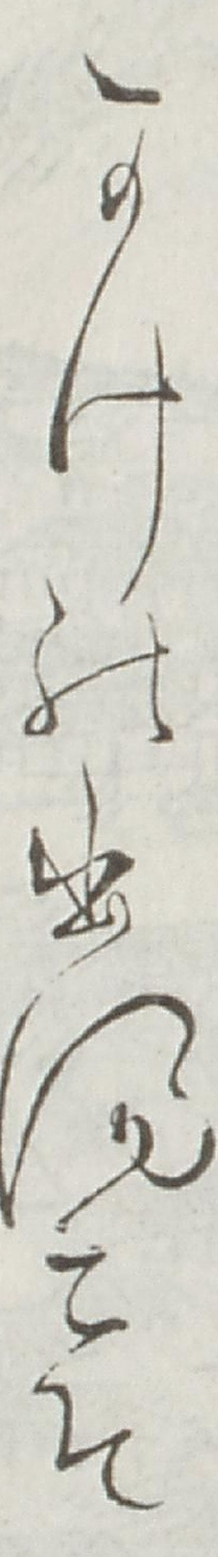かけの出湯こそ
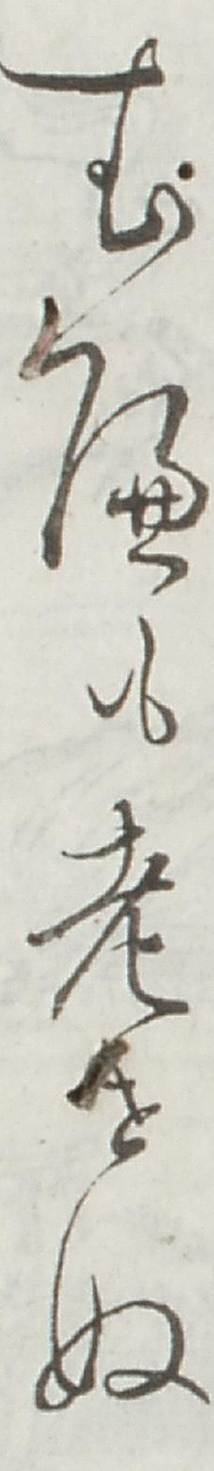むへも老せぬ
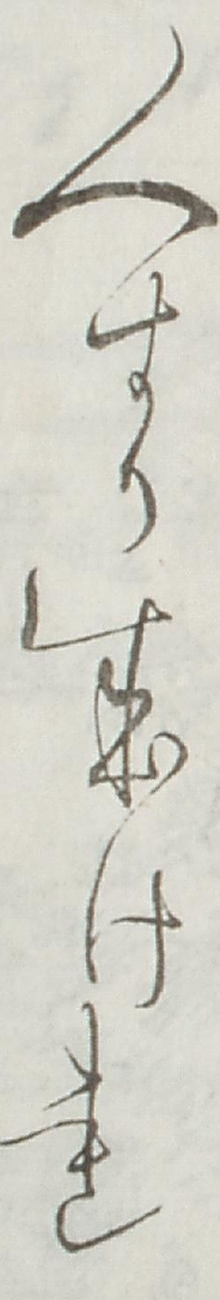くすり成けれ

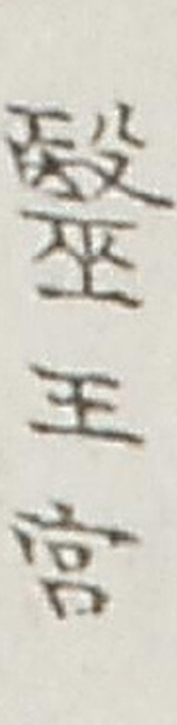毉王宮
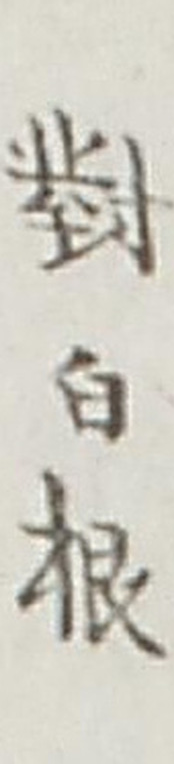對白根
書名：草津温泉誌　全
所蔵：東京大学地震研究所図書室 Earthquake Research Institute Library, The University of Tokyo, JAPAN
